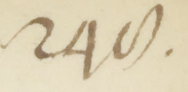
248.
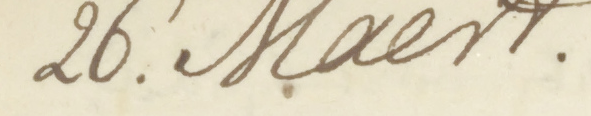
26. Maert.
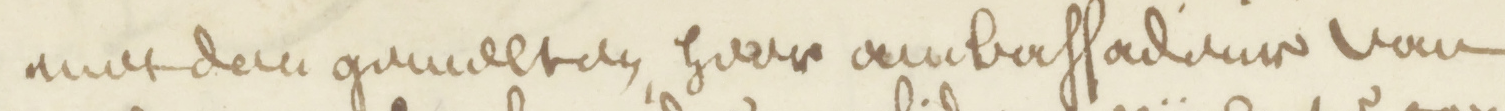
met den gemelten heer ambassadeur van
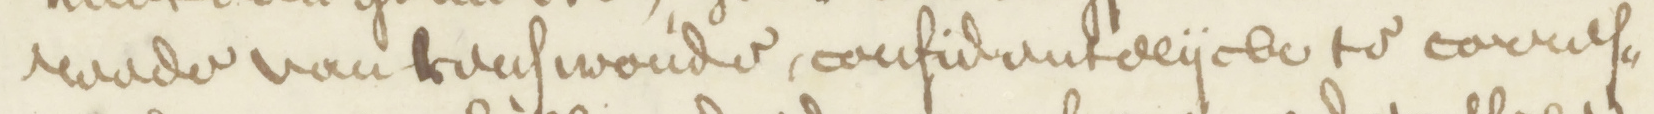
reede van renswoude, confidentelijck te corres,,
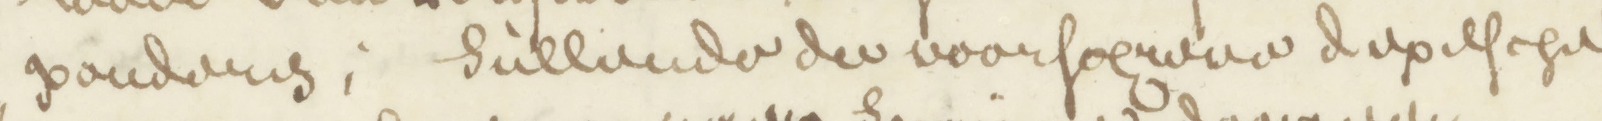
„ponderen; Sullende de voorschreve depesche
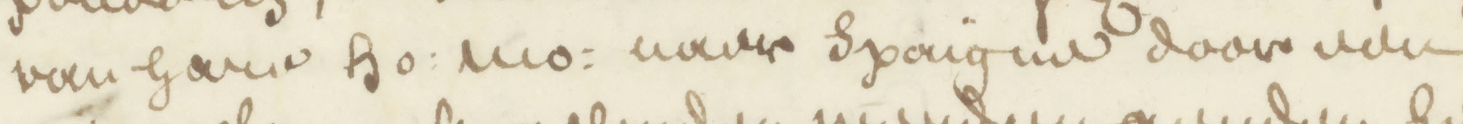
van hare Ho:Mo: naer Spaigne door een
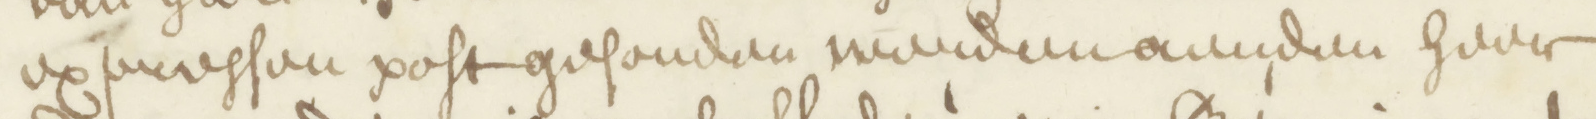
expressen post gesonden werden aenden heer
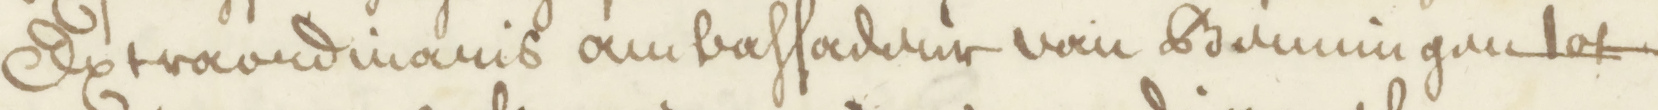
Extraordinaris ambassadeur van Beuningen tot
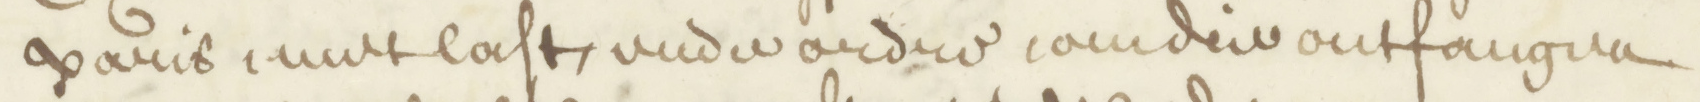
paris, met last, ende ordre, om die ontfangen
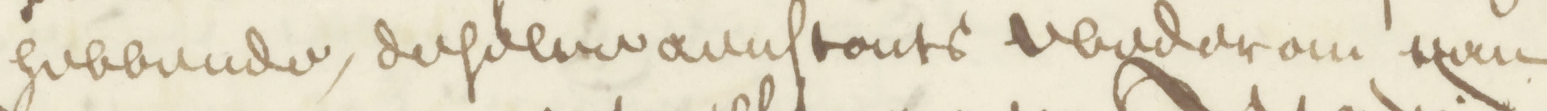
hebbende, deselve aenstonts wederom van
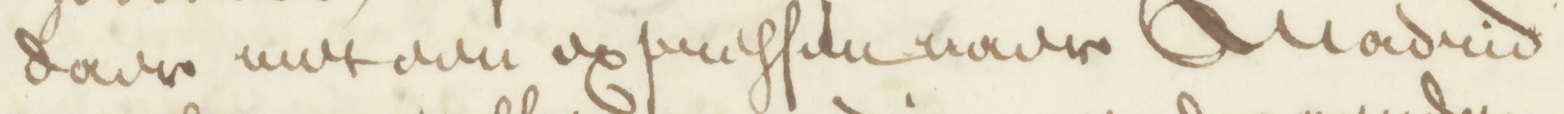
daer met een expressen naer Madrid
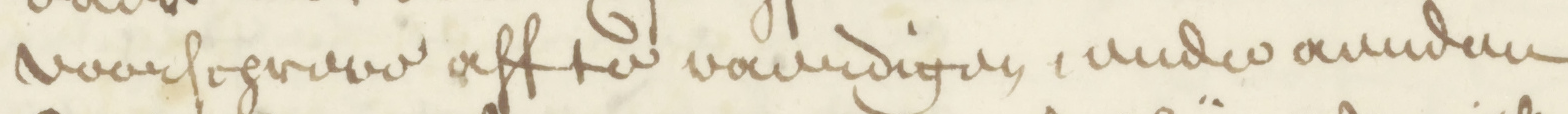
voorschreve aff te vaerdigen, ende aenden
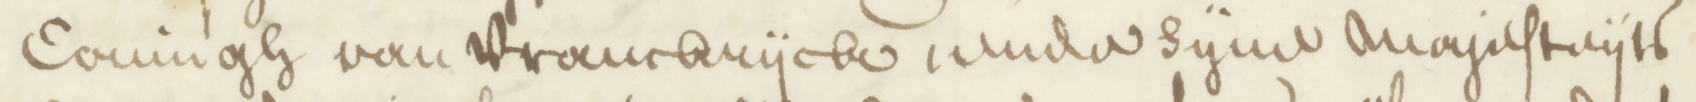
Coningh van Vranckrijck, ende sijne Majesteijts
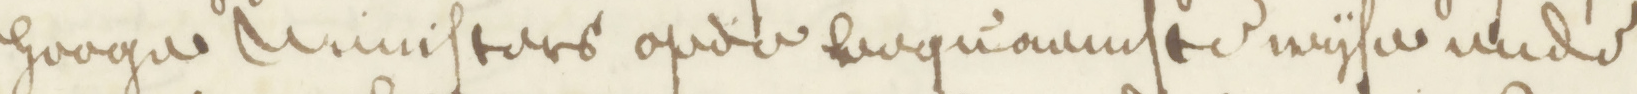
hooge Ministers opde bequaemste wijse ende
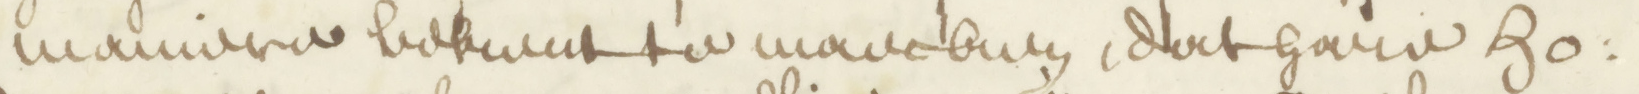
maniere bekent te maecken, dat hare Ho:
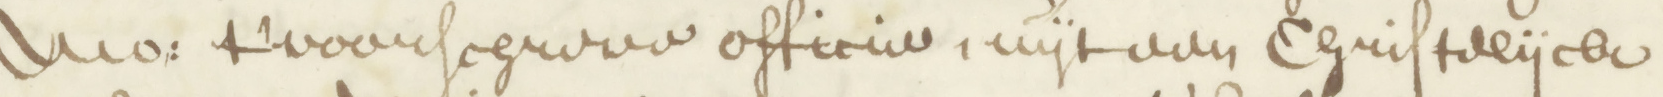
Mo: t'voorschreve officie, uijt een Christelijck
